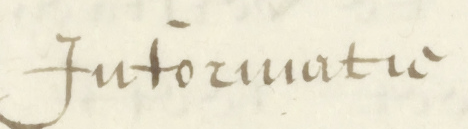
Informatie
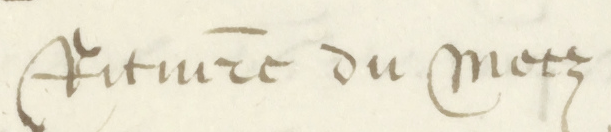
Ritmre du Metz
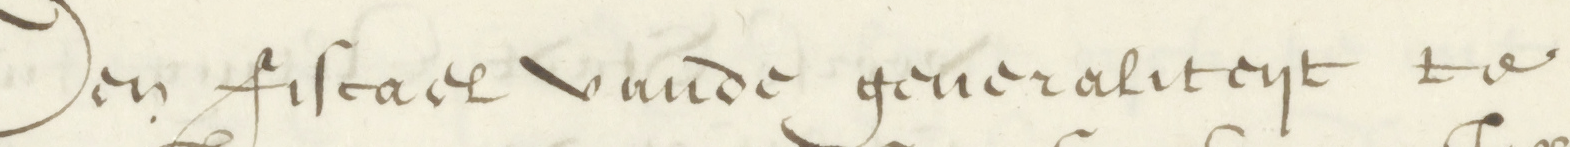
Den fiscael vande generaliteyt te
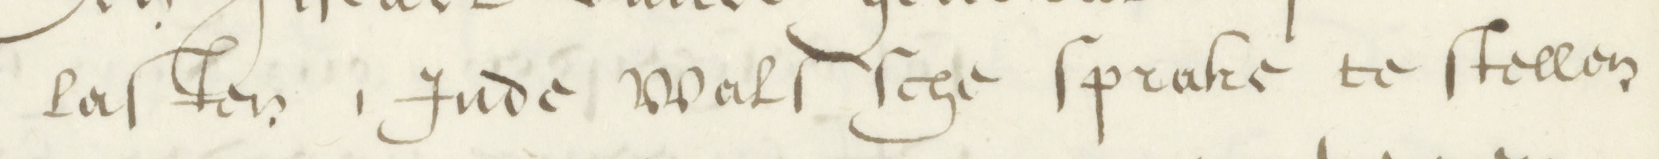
lasten, Inde Walssche sprake te stellen
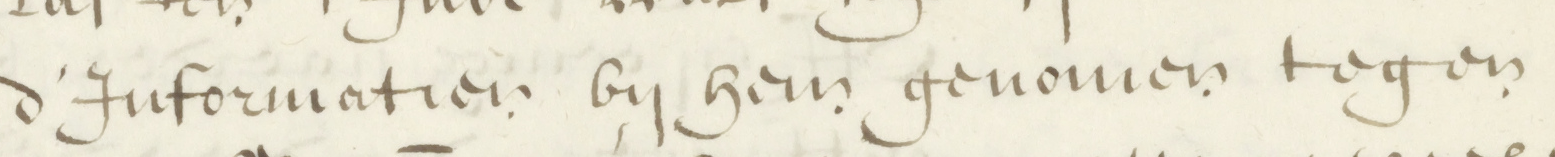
d'Informatien by hem genomen tegen
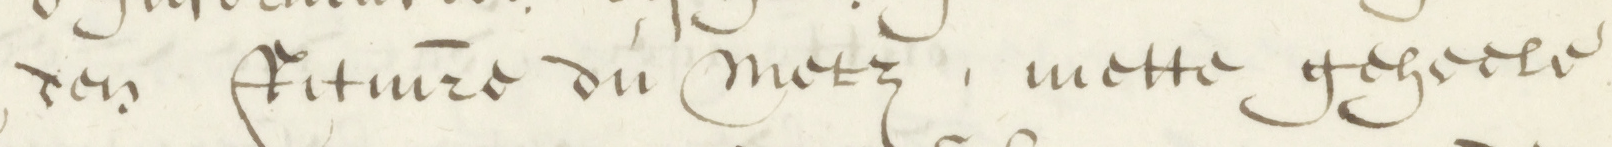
den Ritmre du Metz, mette geheele
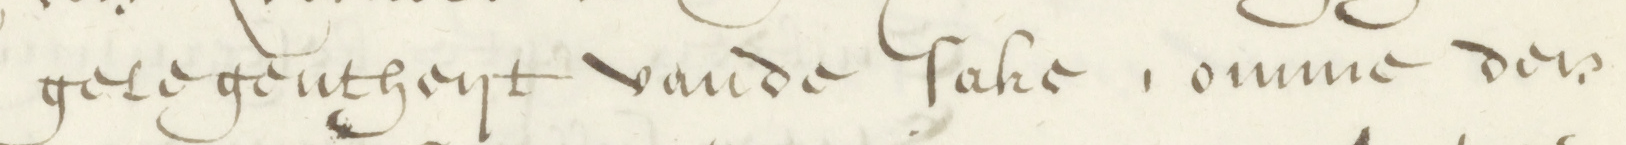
gelegentheyt vande sake, omme den
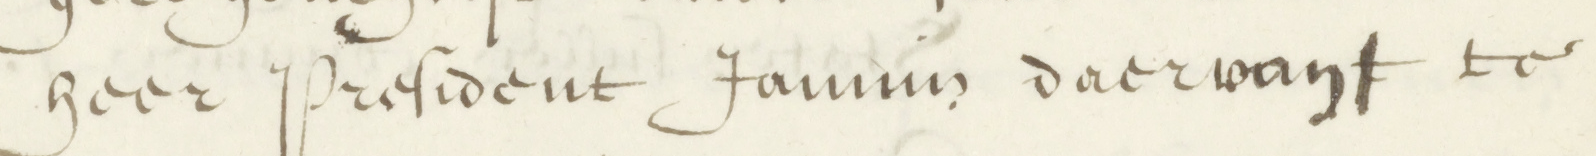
heer President Jannin daervant te
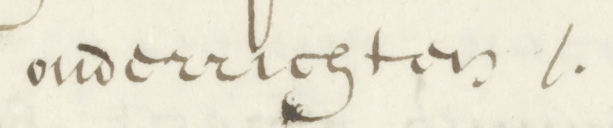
onderrichten.
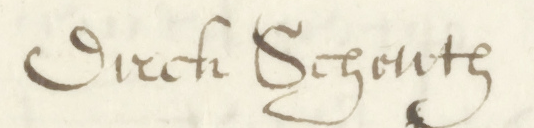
Dirck Schouth
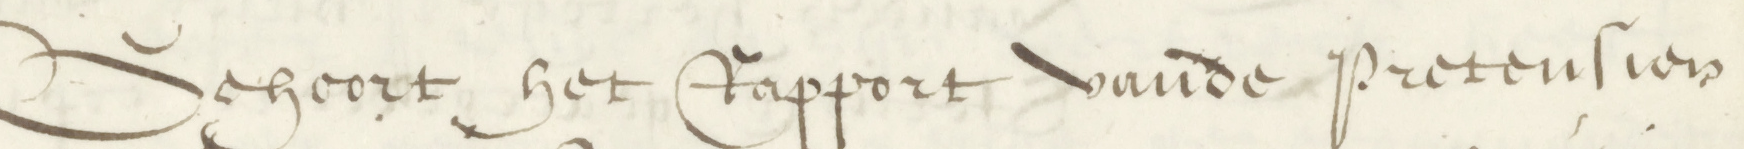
Gehoort het Rapport vande pretensien
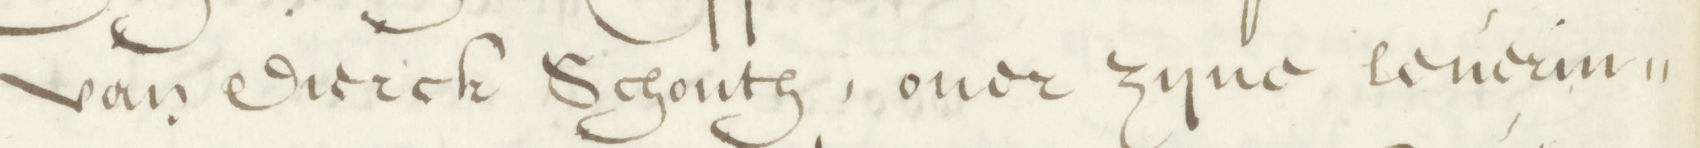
van Dierck Schouth, ouer zyne leuerin,,
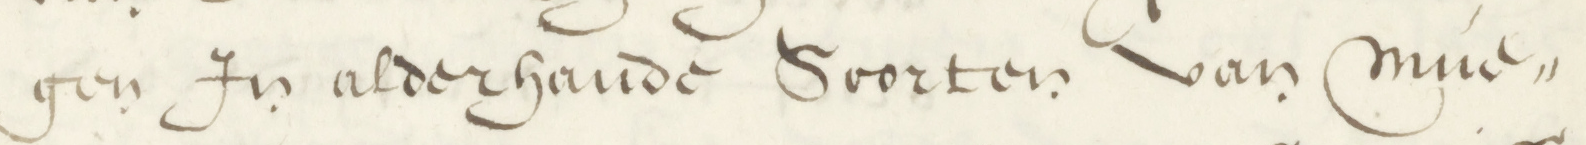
gen In alderhande Soorten van mue,,
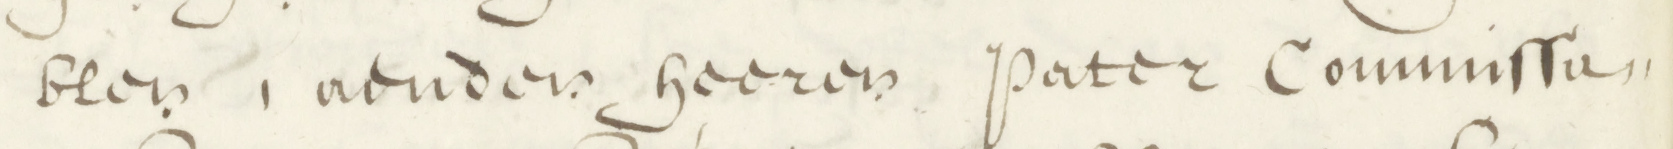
blen, aenden heeren pater Commissa,,
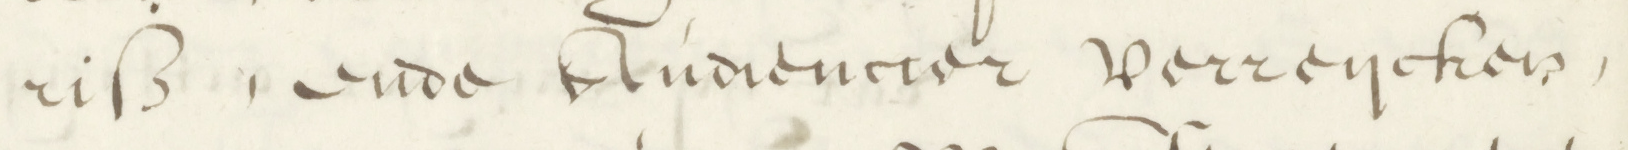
ris, ende Audiencier Verreycken,
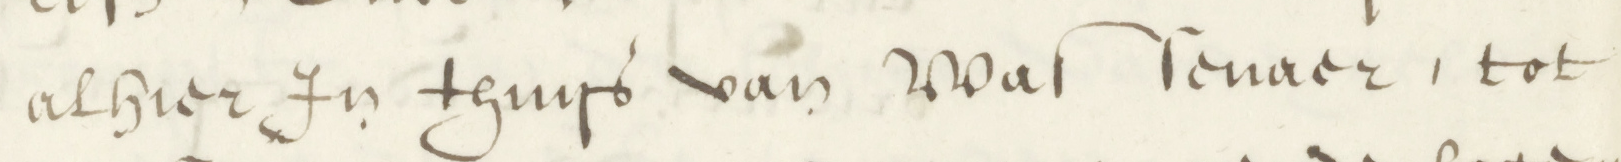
alhier In thuys van Wassenaer, tot
